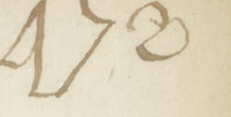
472
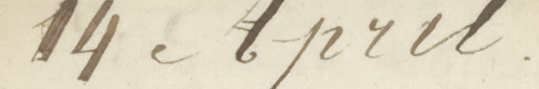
14. April.
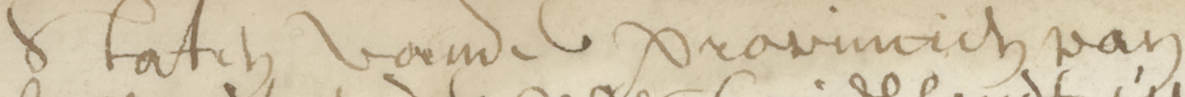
Staten vande provincien van
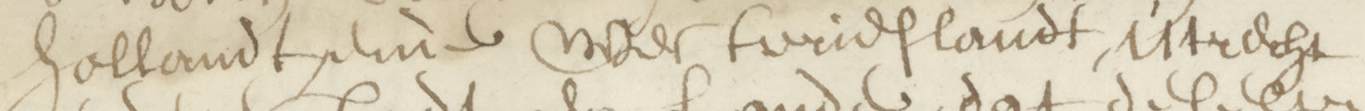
Hollandt, ende Westvrieslandt, Utrecht
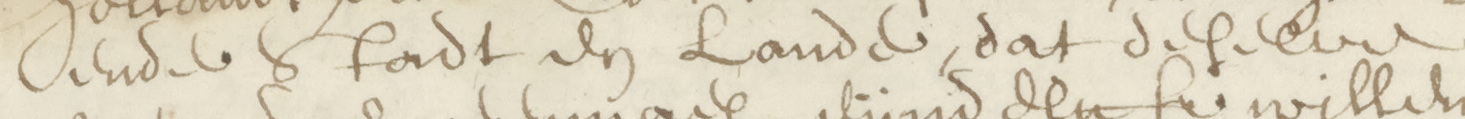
ende Stadt en Lande, dat deselve
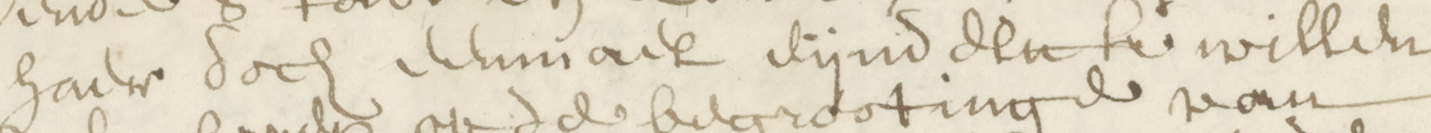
haer doch eenmael eijndelick willen
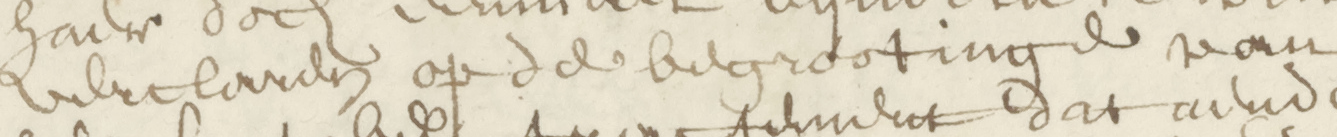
verclaren op de begrootinge van
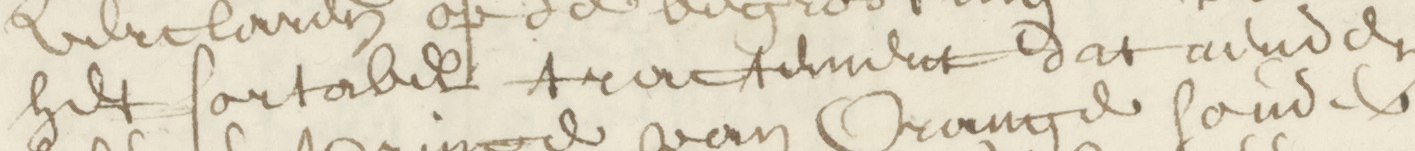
het sortabel tractement dat aenden
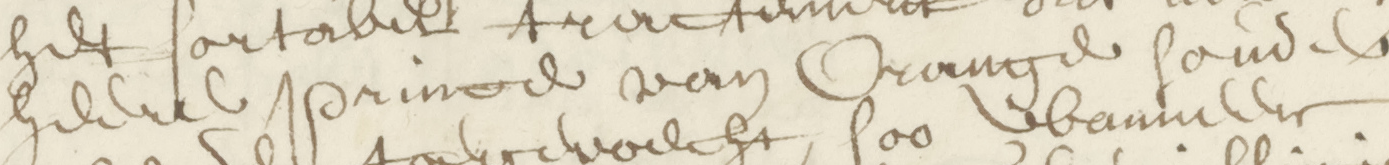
heere Prince van Orange soude
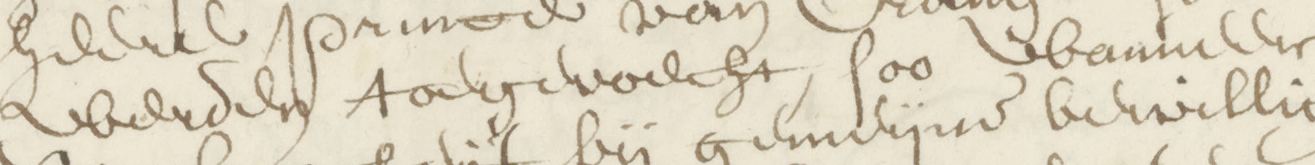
werden toegevoecht, soo wanneer
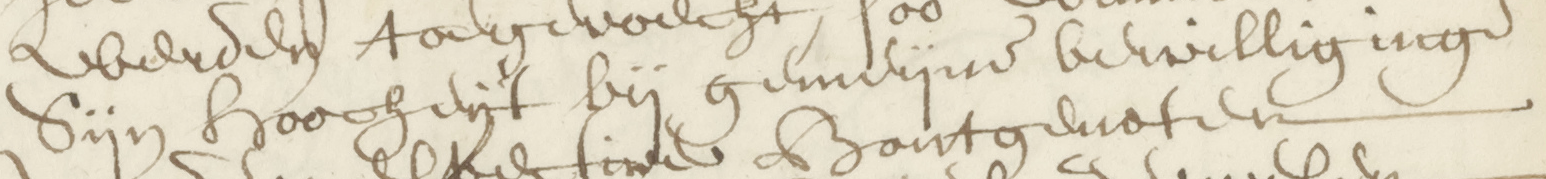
Sijn Hoocheijt bij gemeijne bewilliginge
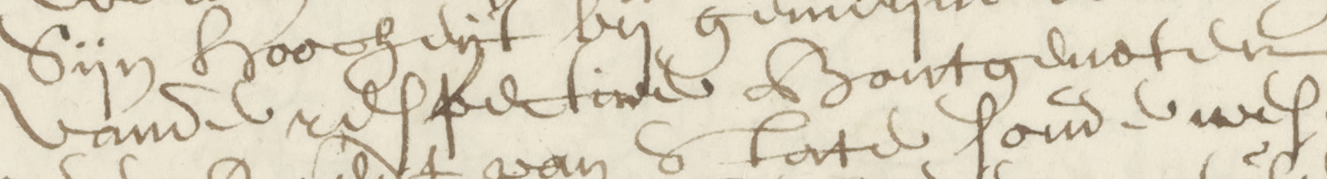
vande respective Bontgenoten
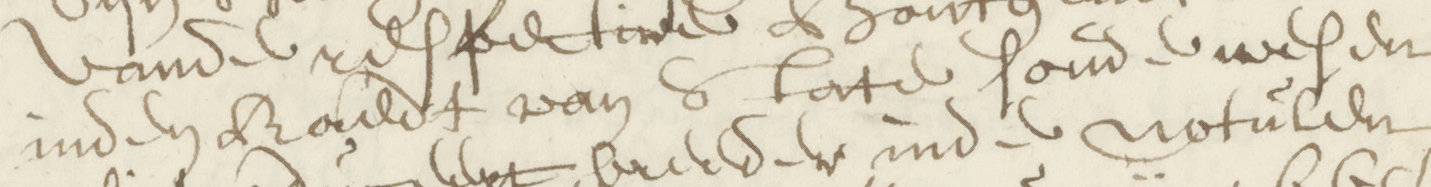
inden Raedt van State soude wesen
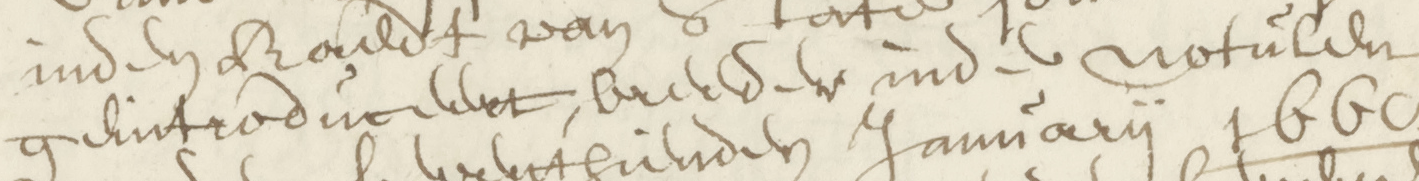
geintroduceert, breeder inde notulen
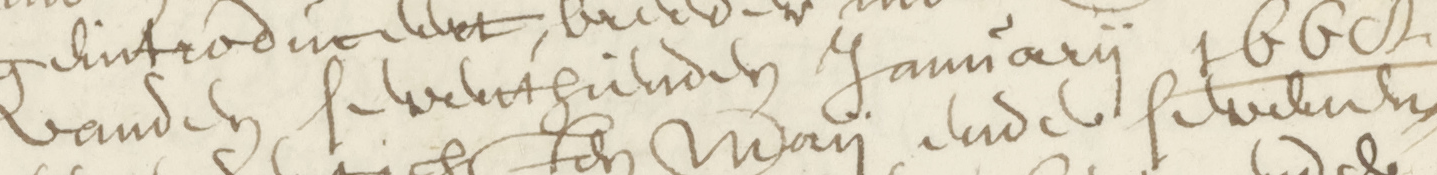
vanden seventhienden Januarij 1668.
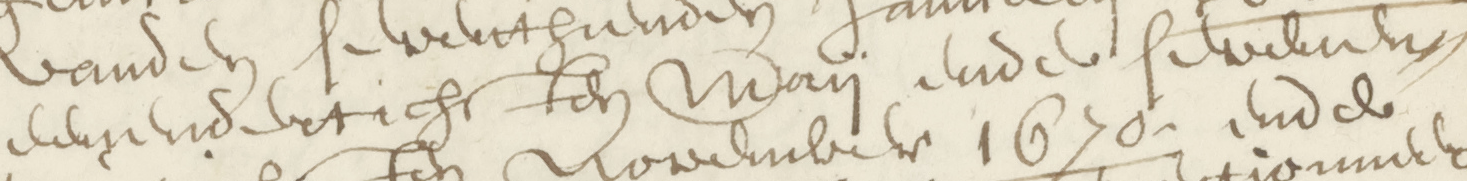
eenendertichsten Maij ende sevenen„
